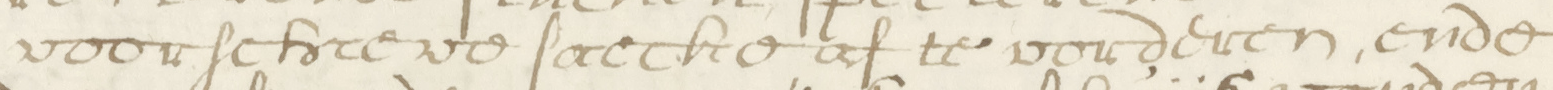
voorschreve saecke af te vorderen, ende
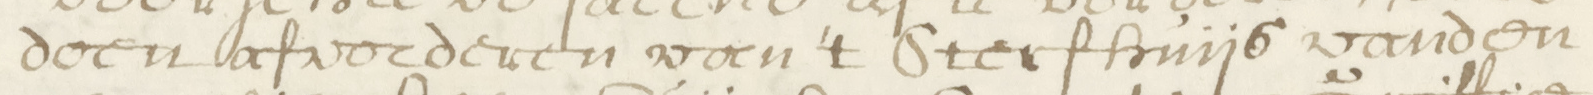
doen afvorderen van 't Sterfhuijs vanden
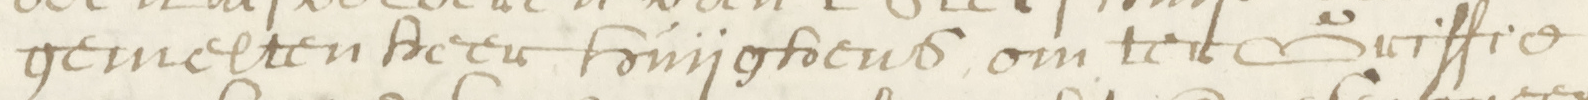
gemelten heer huijghens, om ter Griffie
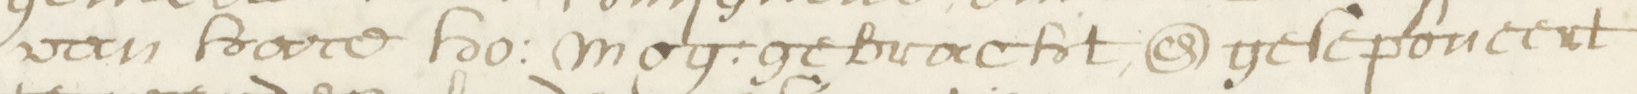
van hare ho:mog: gebracht & geseponeert
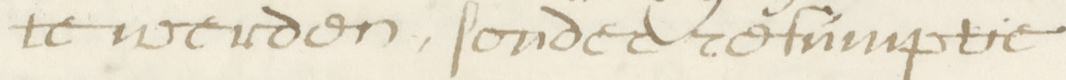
te werden, sonder resumptie.
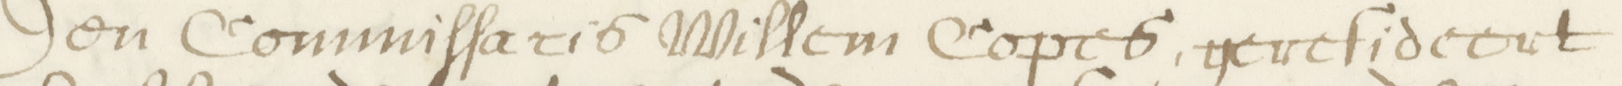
Den Commissaris Willem Copes, geresideert
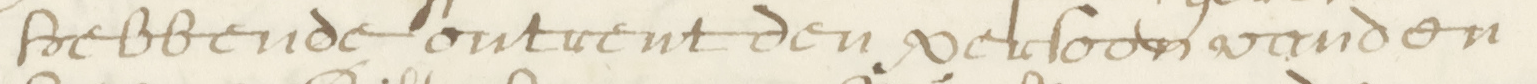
hebbende ontrent den persoon vanden
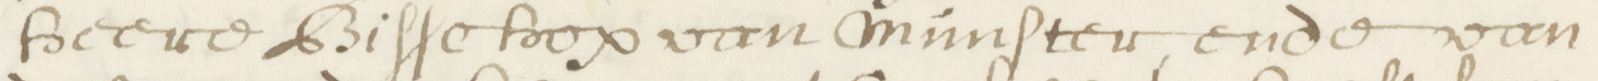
heere Bisschop van munster, ende van
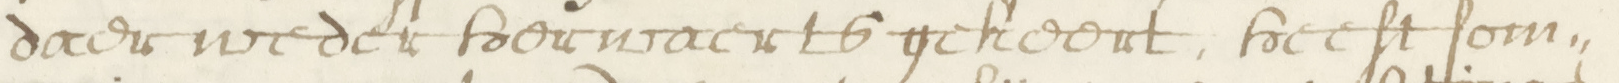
daer weder herwaerts gekeert, heeft som,,
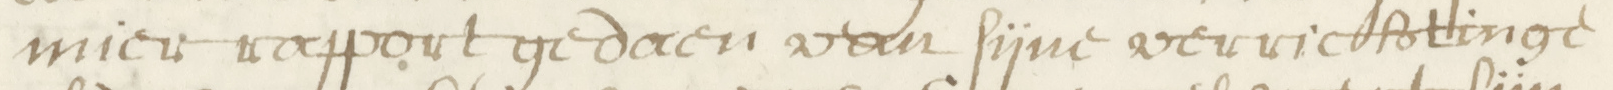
mier rapport gedaen van sijne verrichtinge
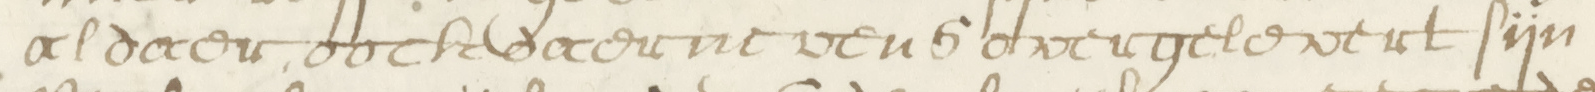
aldaer, oock daernevens overgelevert sijn
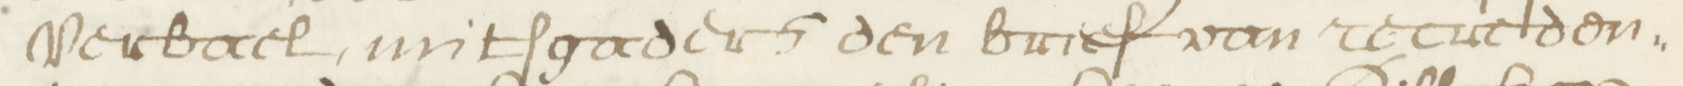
Verbael, mitsgaders den brief van recreden,,
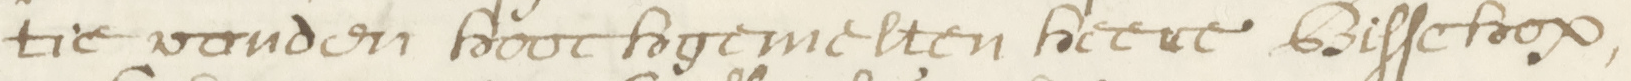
tie van den hoochgemelten heere Bisschop,
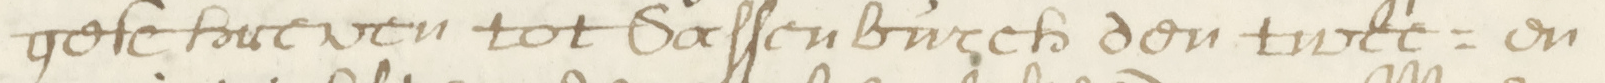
geschreven tot Sassenburch den twee= en
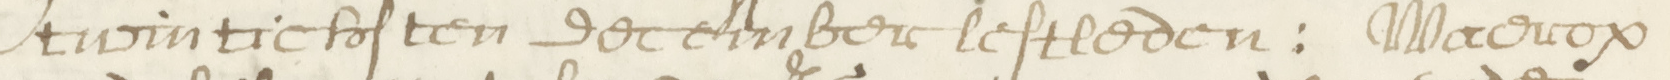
twintichsten december lestleden: Waerop
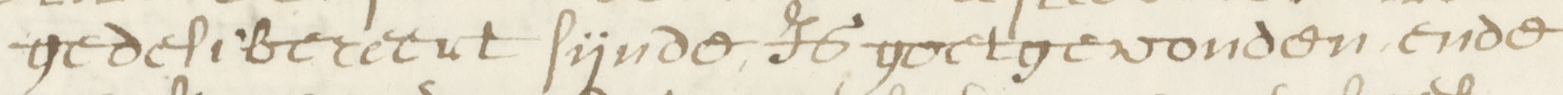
gedelibereert sijnde, Is goetgevonden ende
